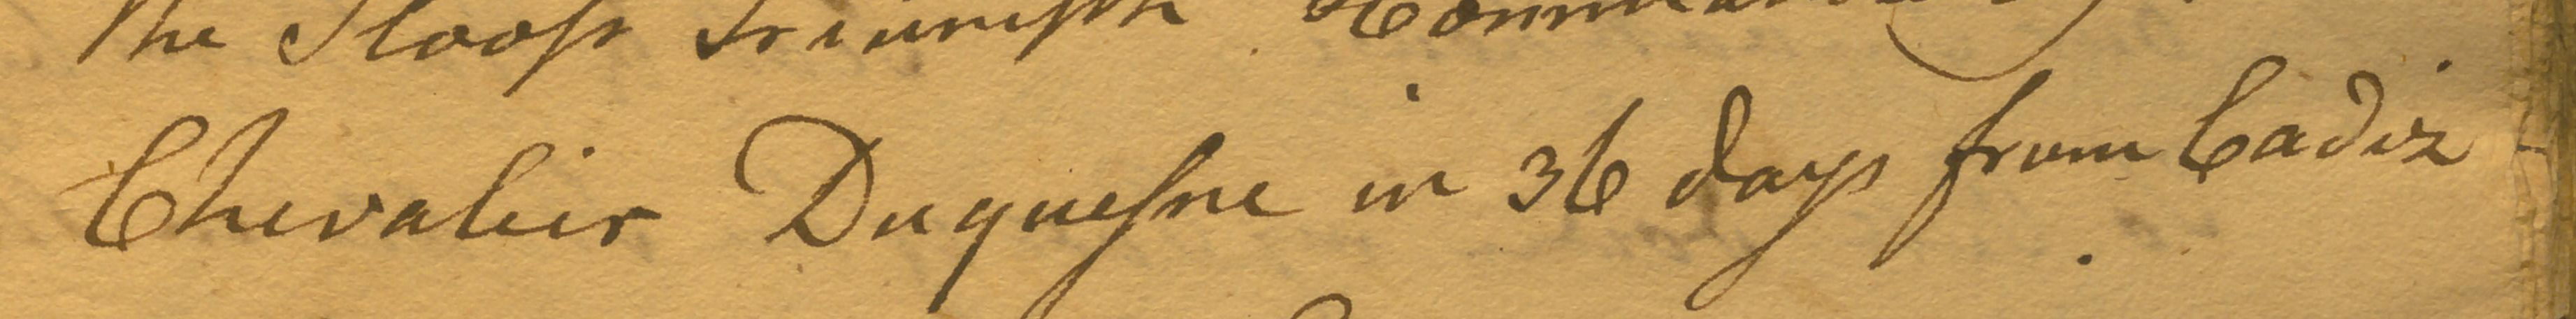Chevalier Duquesne in 36 days from Cadiz
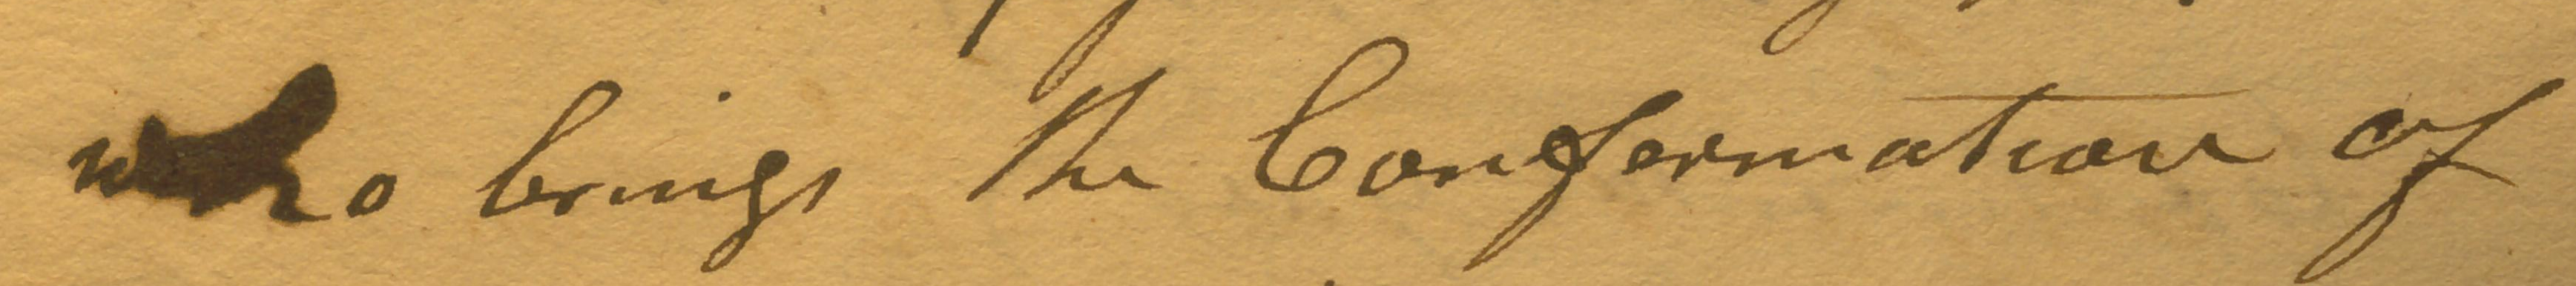who brings the Confermation of
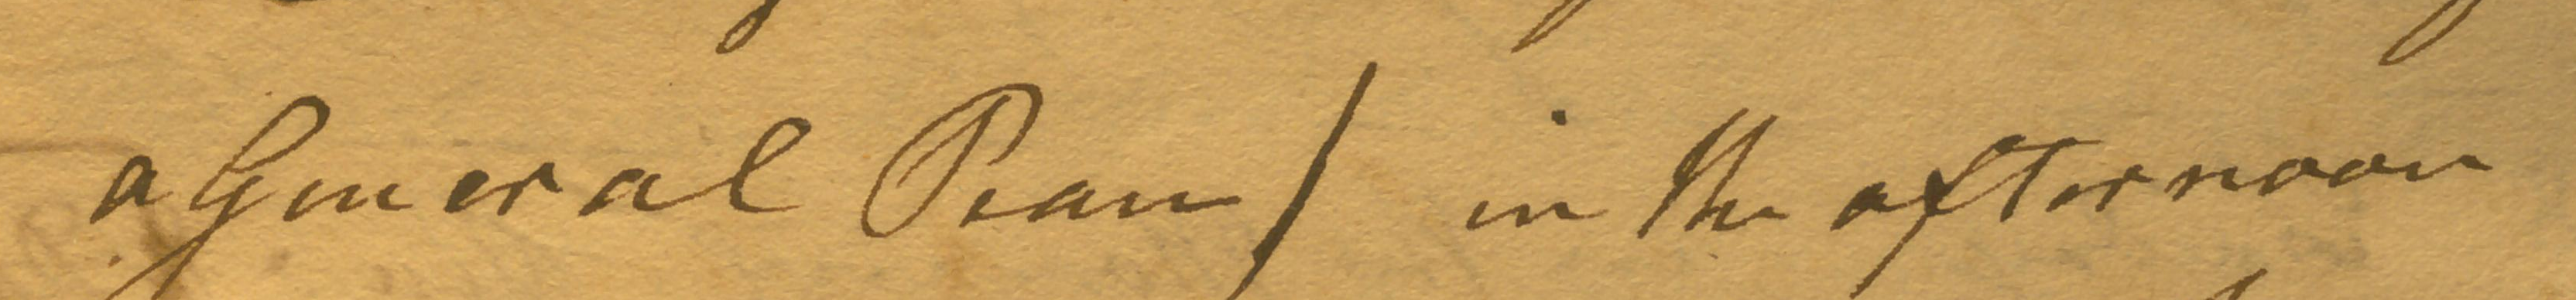a General Peace/ in the afternoon
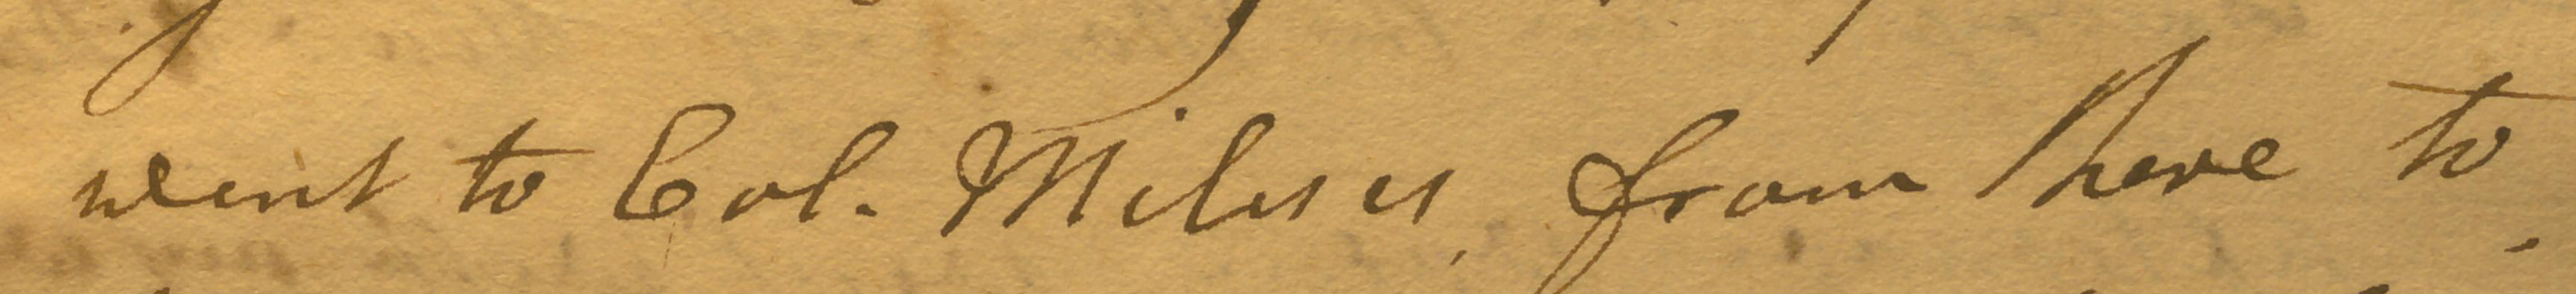went to Col. Mileses from there to
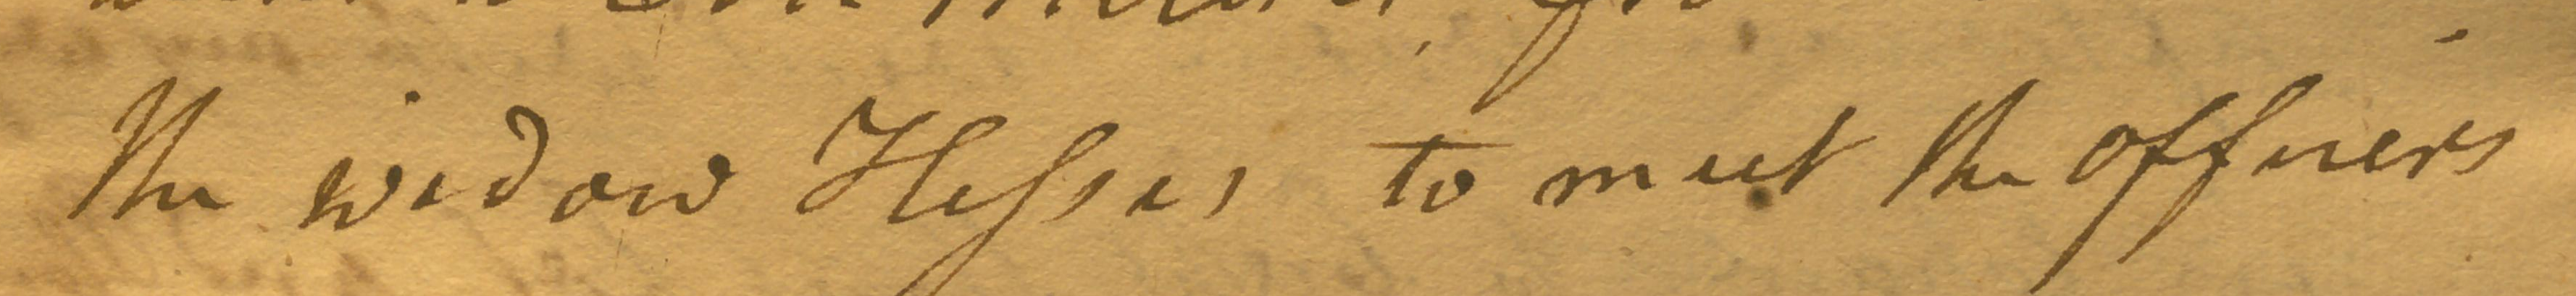the widow Hesses to meet the officers
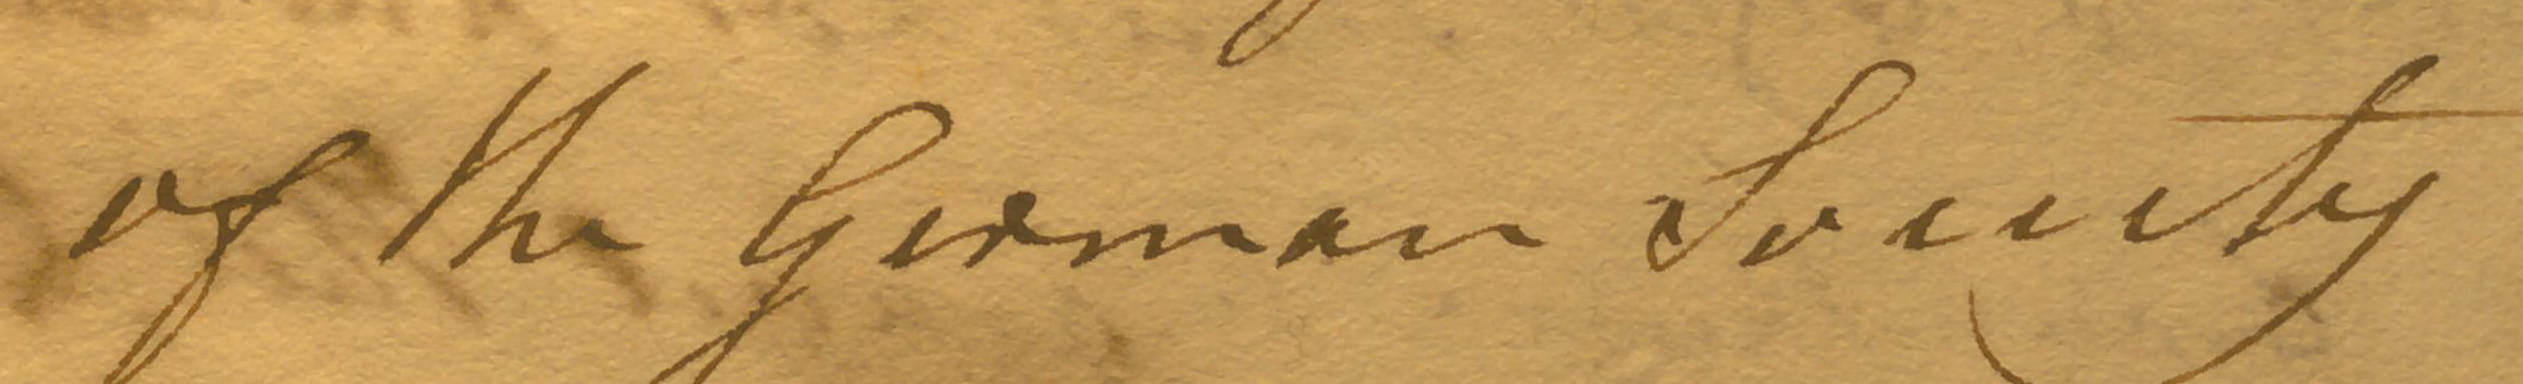of the German Soceety
